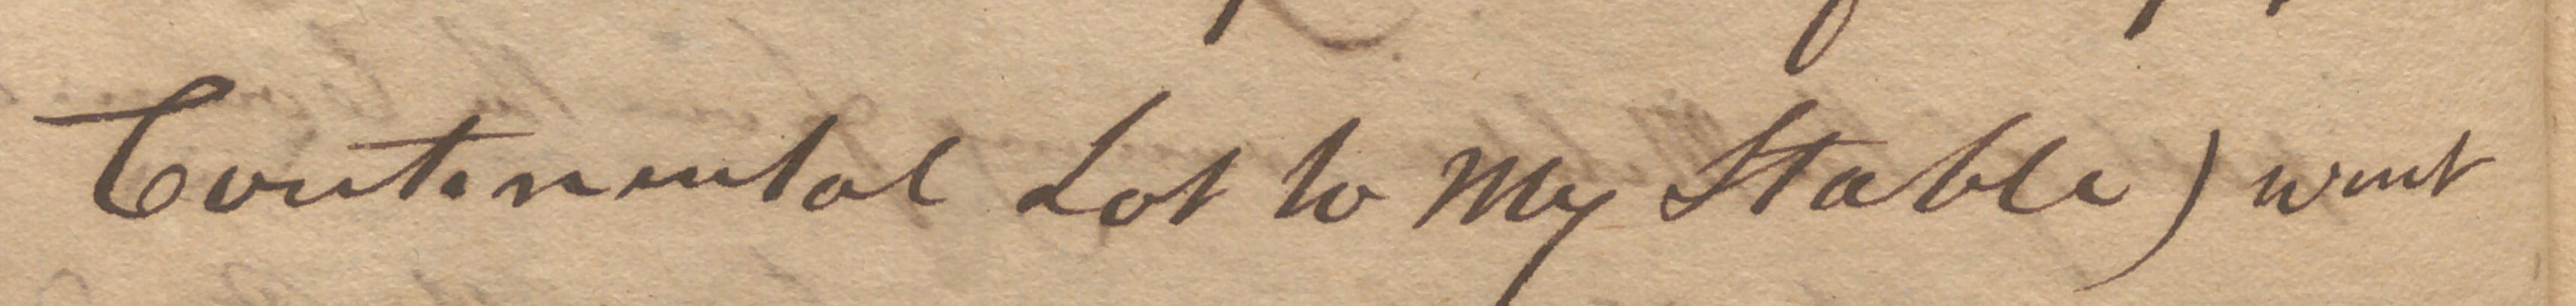Continental Lot to My Stable) went
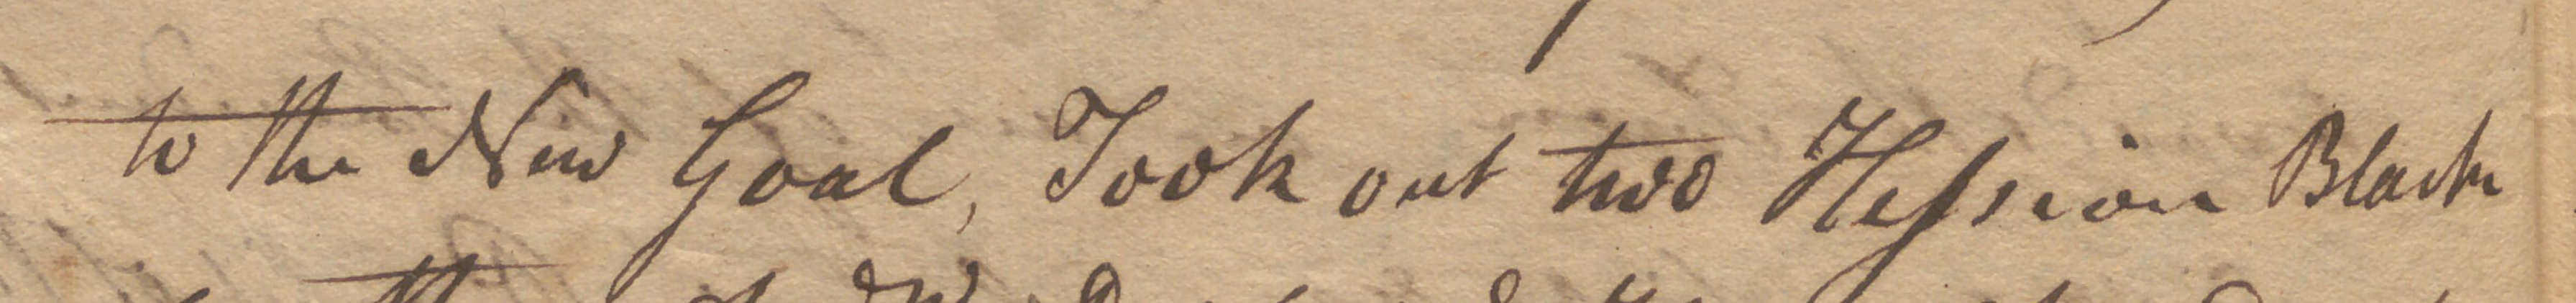to the New Goal Took out two Hessian Black
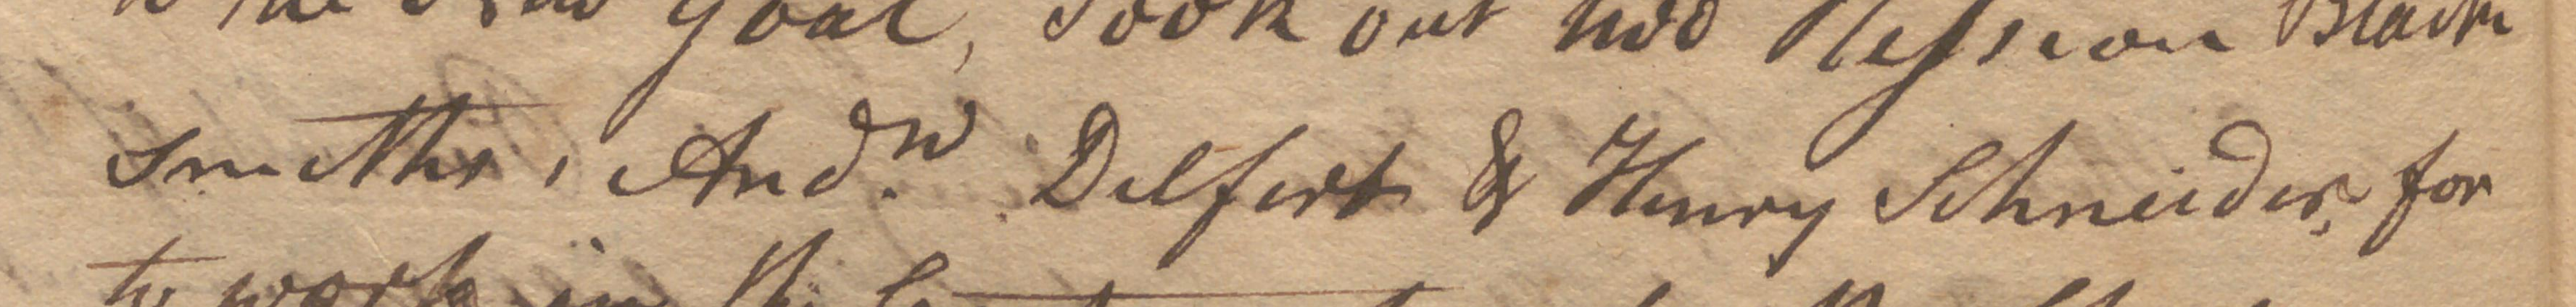smiths, And^w. Delfert & Henry Schneider for
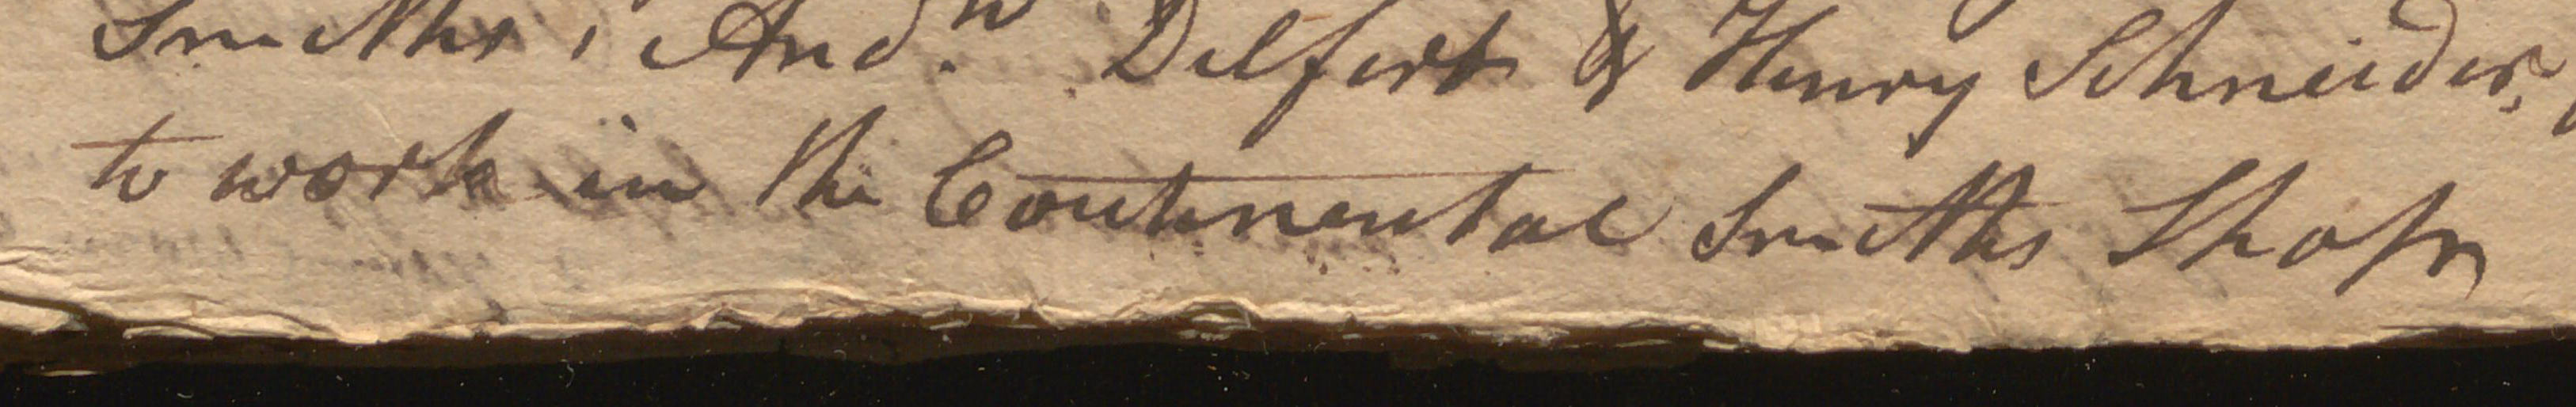to work in the Continental Smiths shop
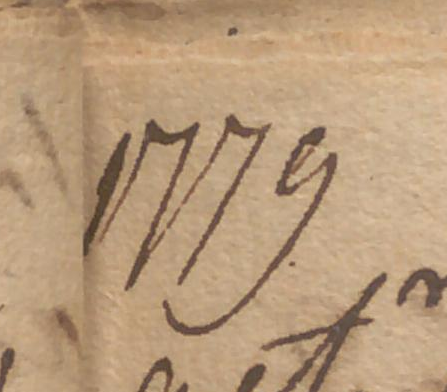1779
